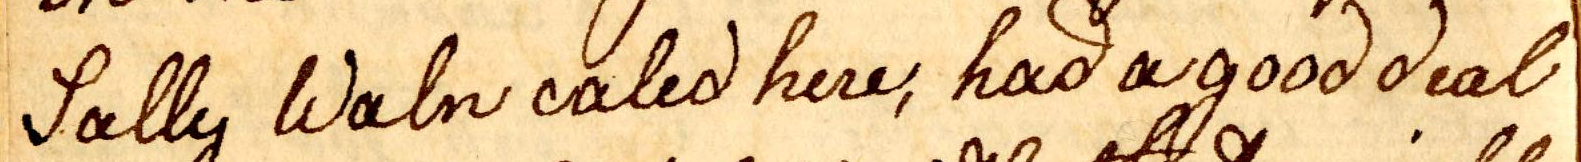Sally Waln caled here, had a good deal
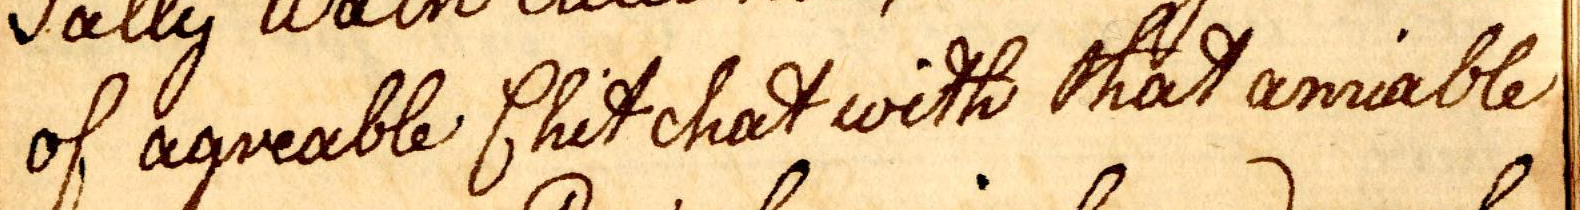of agreable Chit chat with that amiable
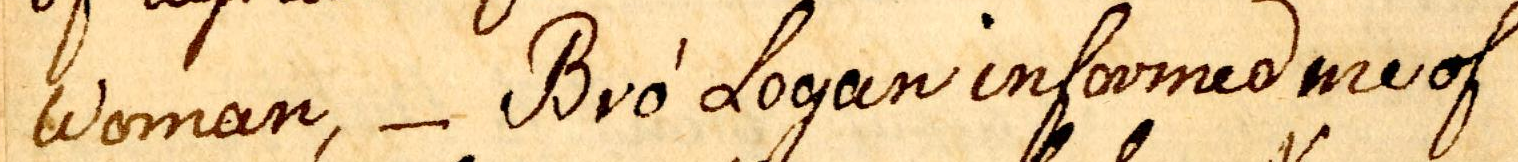Woman,- Bro' Logan informed me of
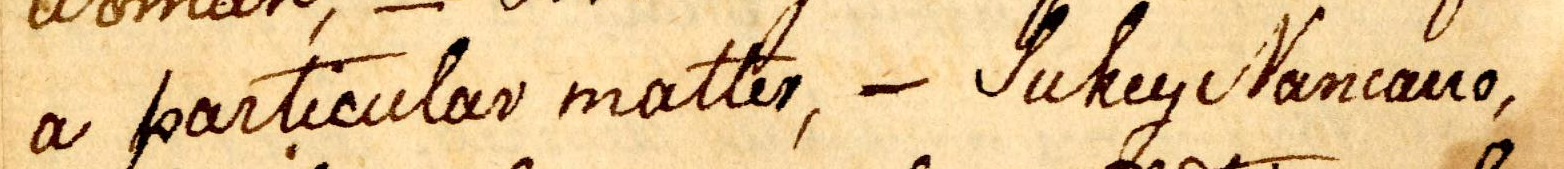a particular matter,- Sukey Nancarro,
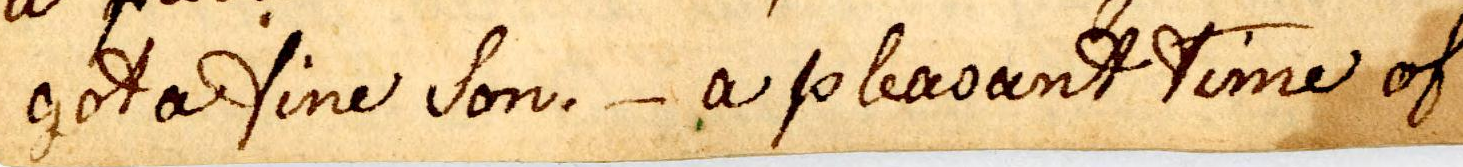got a fine Son.- a pleasant time of
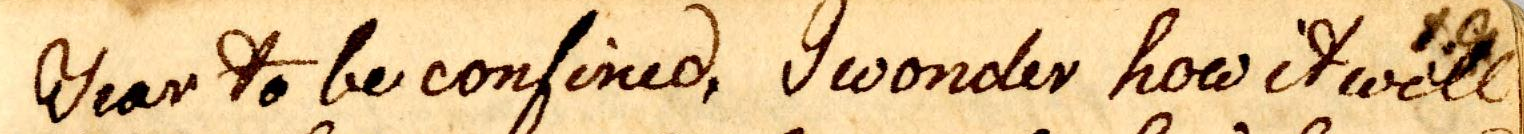Year to be confined, I wonder how it will
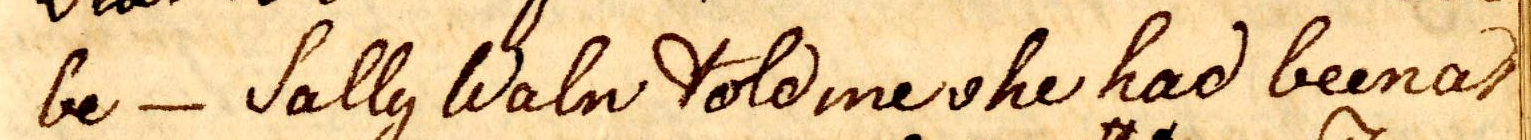be- Sally Waln told me she had been at
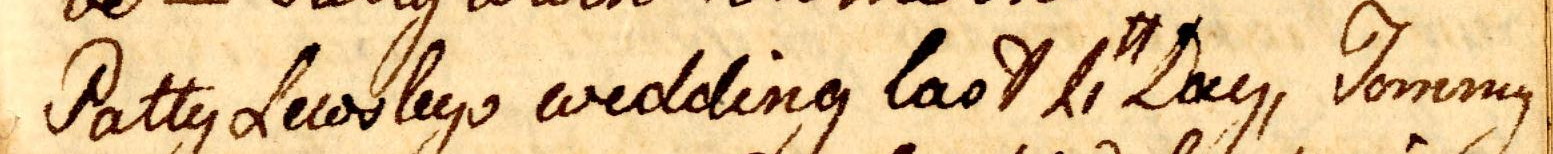Patty Lewsleys wedding last 4^th Day, Tommy
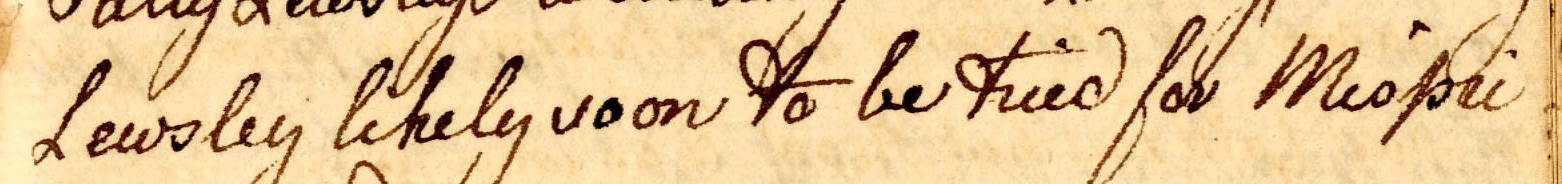Lewsley likely soon to be tried for Mispri
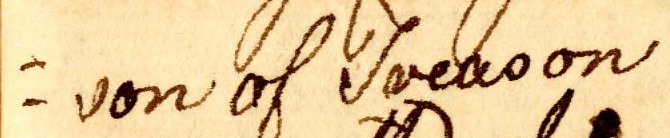-son of Treason
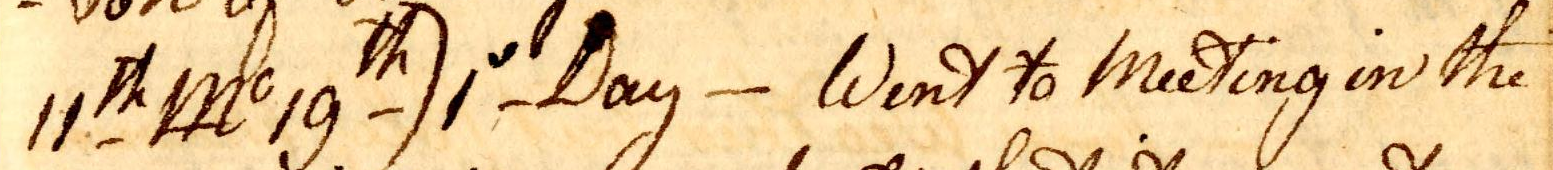11^th M^o 19^th) 1^st Day- Went to Meeting in the
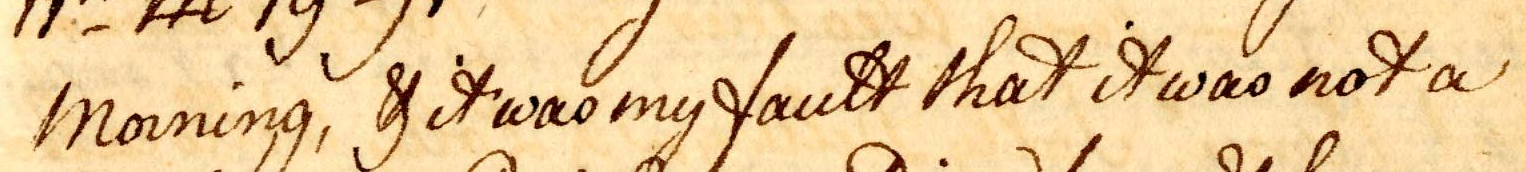Morning, & it was my fault that it was not a
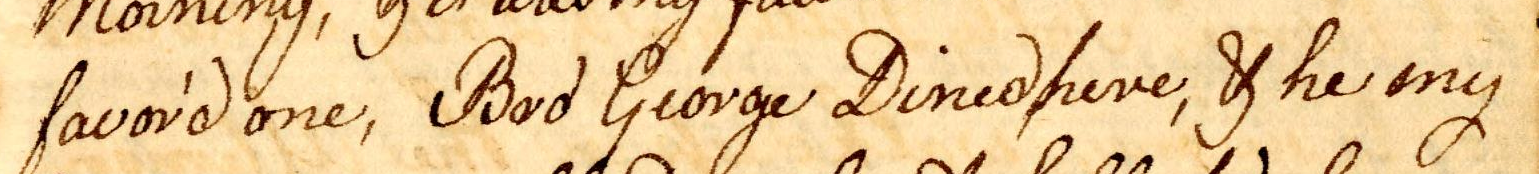favor'd one, Bro' George Dined here, & he my
